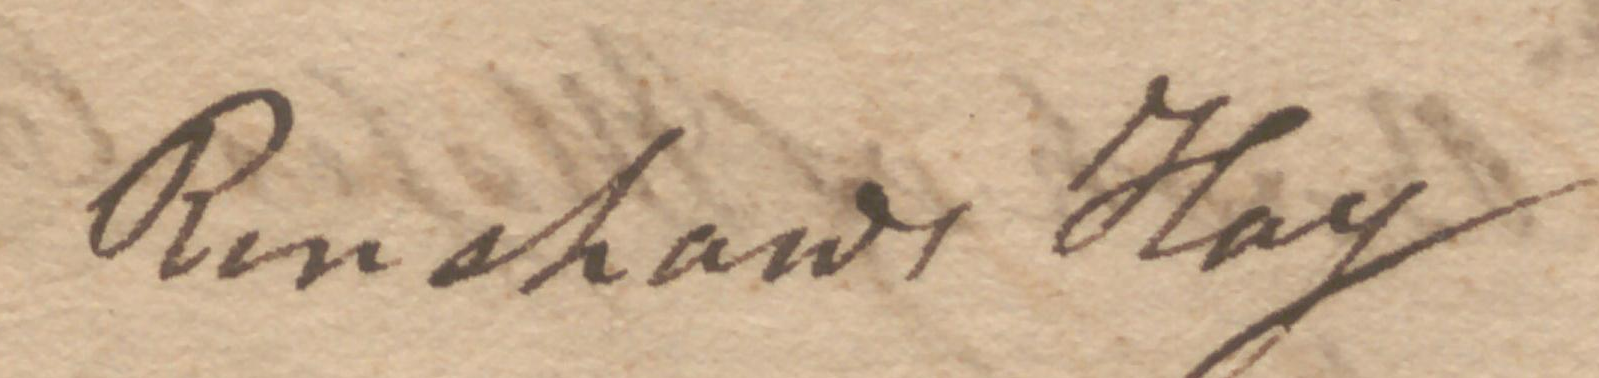Renshaws Hay
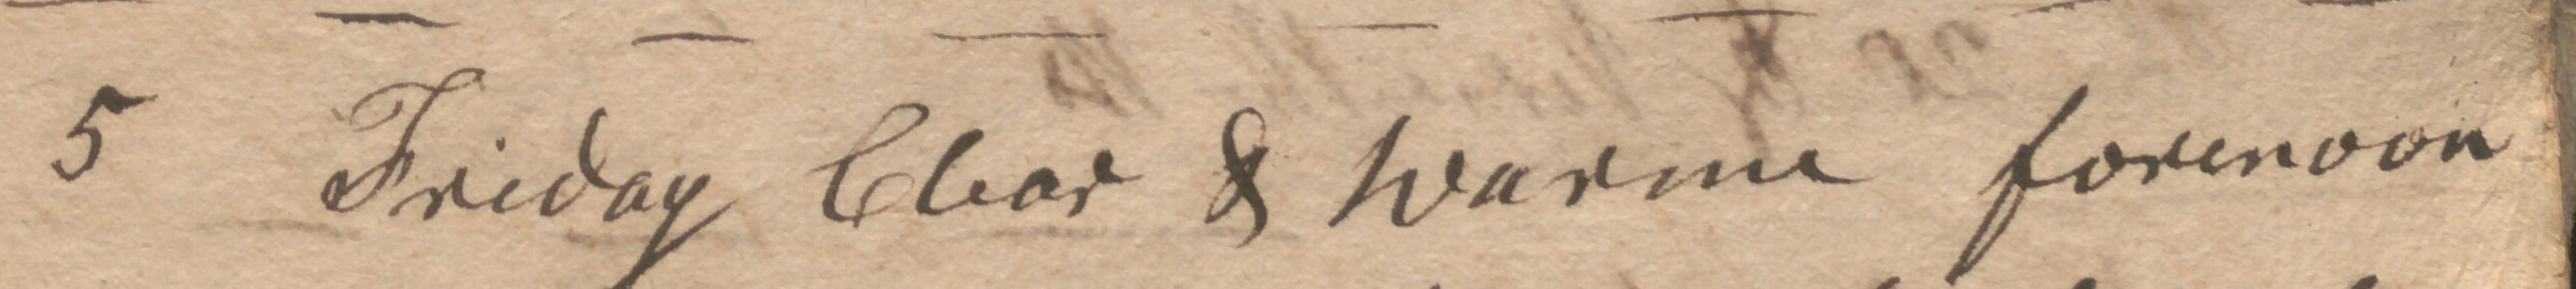5 Friday Clear & warme forenoon
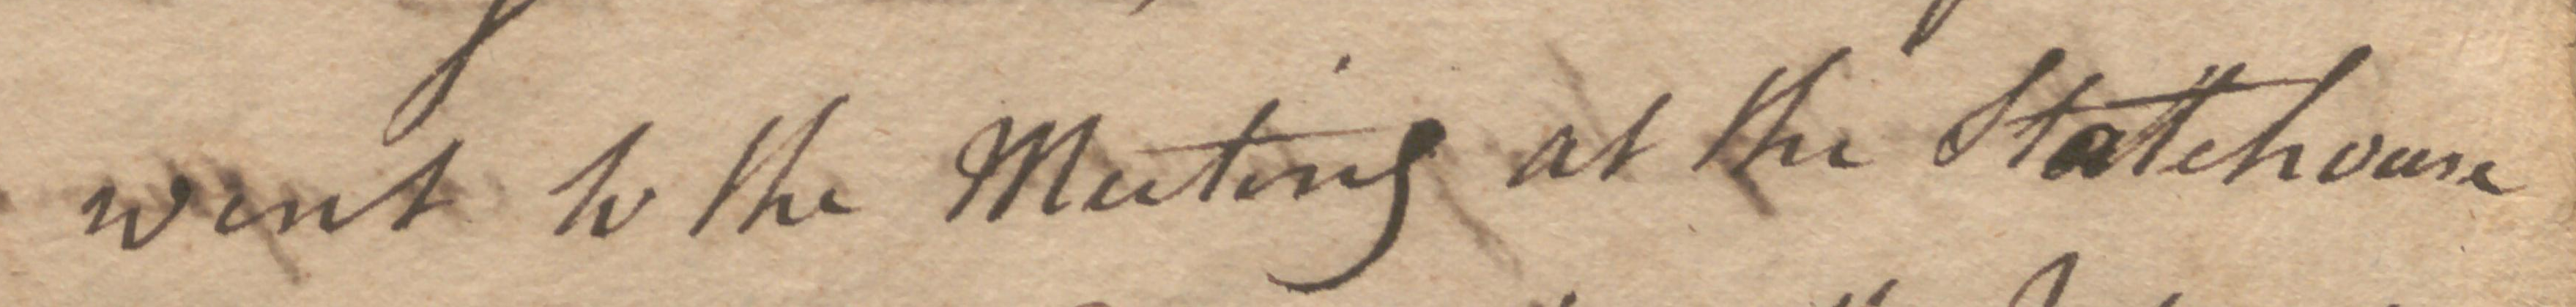went to the Meeting at the Statchouse
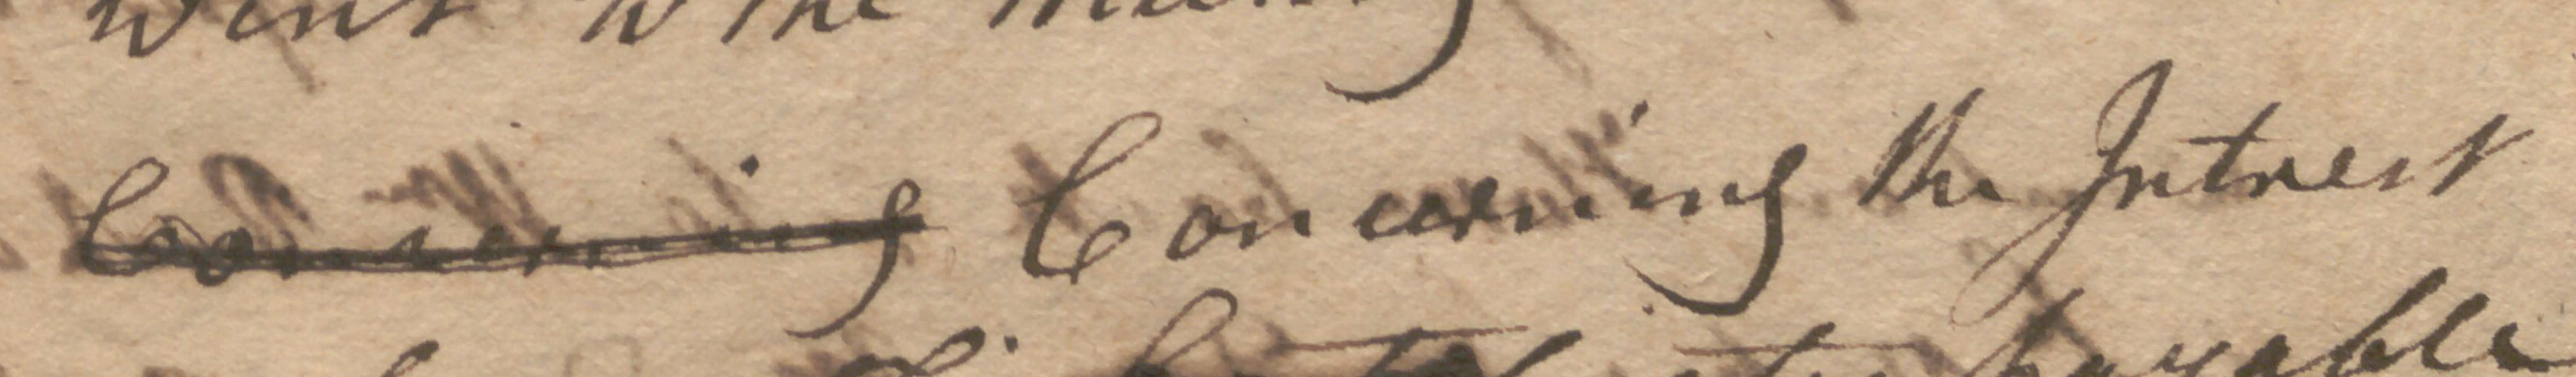[Concerning] Concerning the Intrest
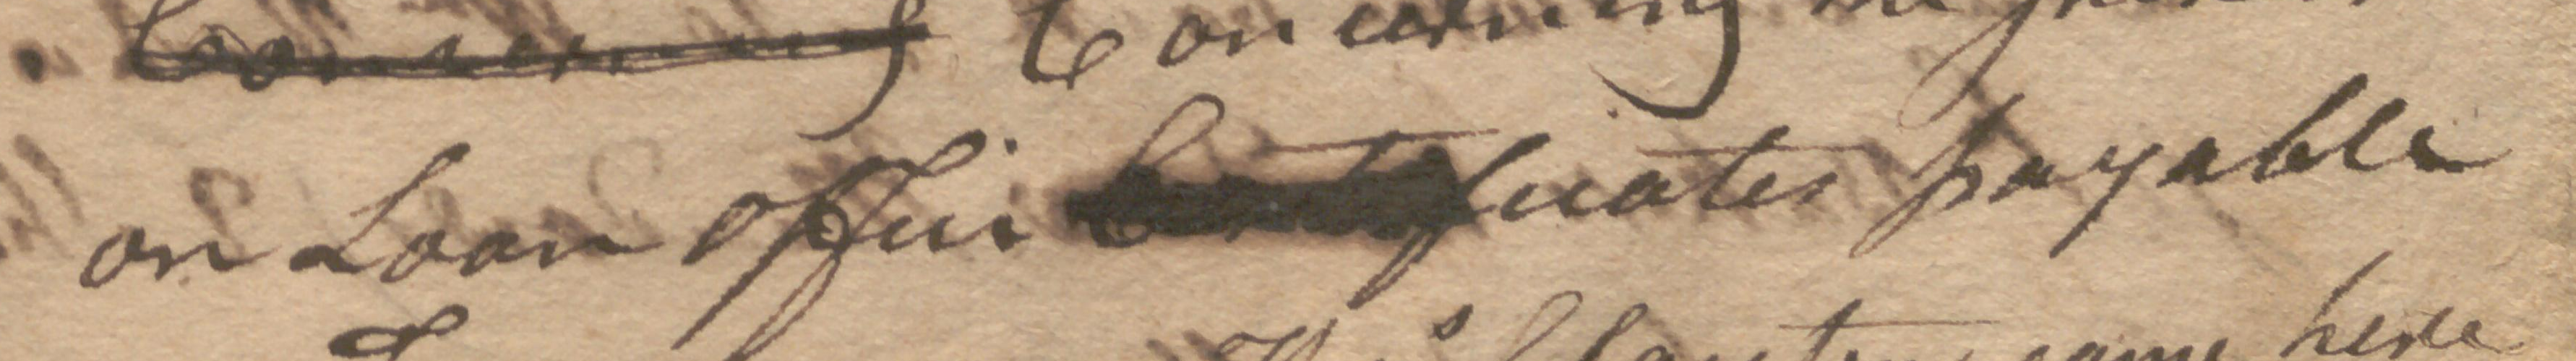on Loon office [Certif]icates payable
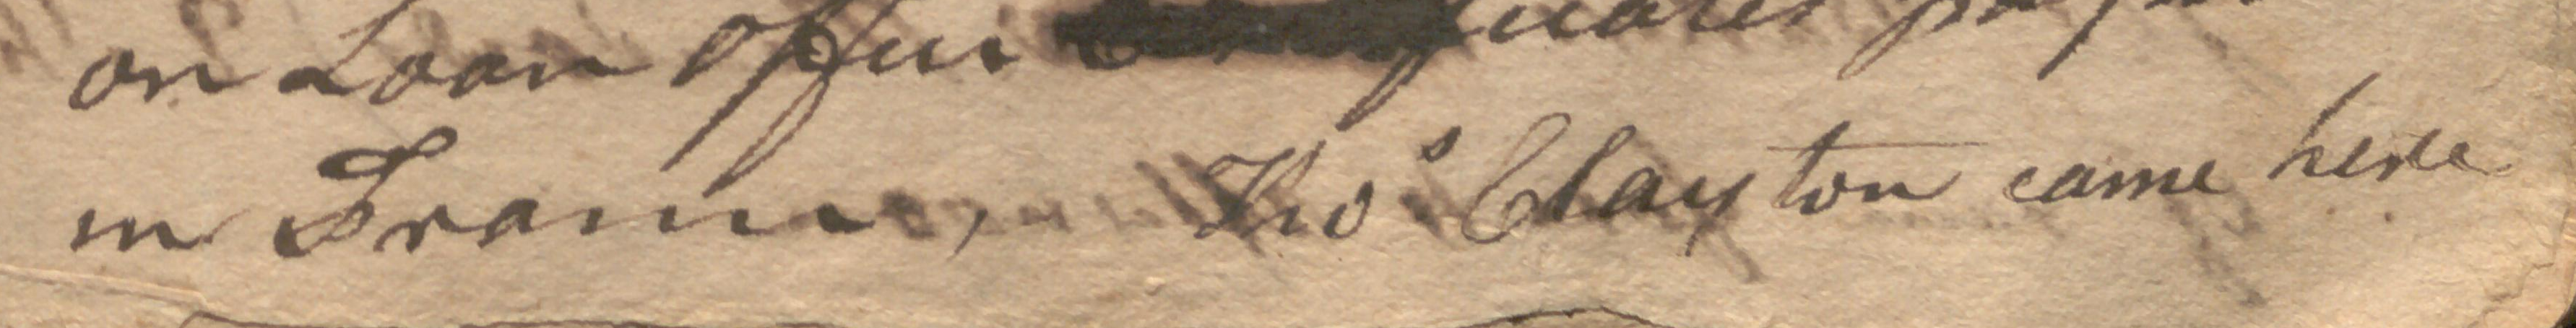in France, Tho^s. Clayton came here
